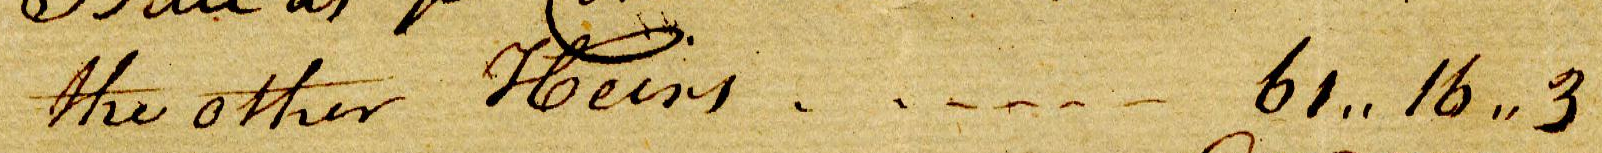the other Heirs. ----- 61..16..3
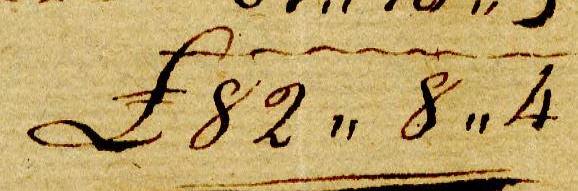£82.. 8..4
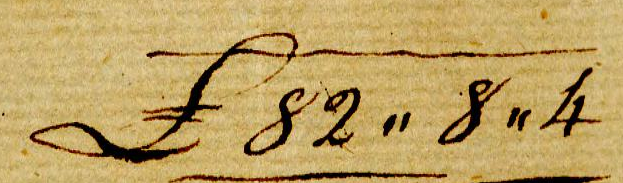£82.. 8..4
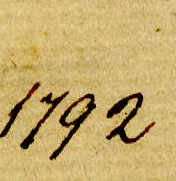1792
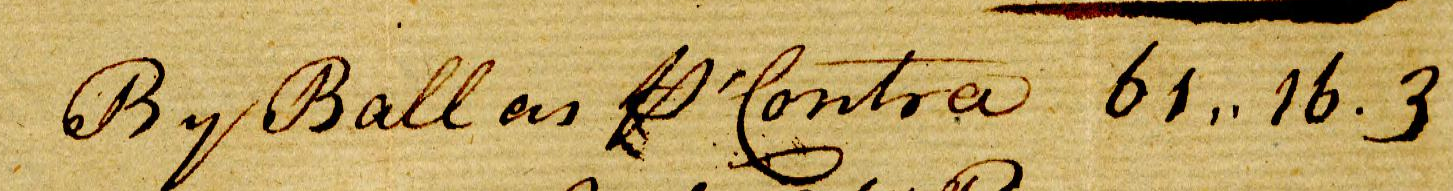By Ball as per Contra 61..16.3
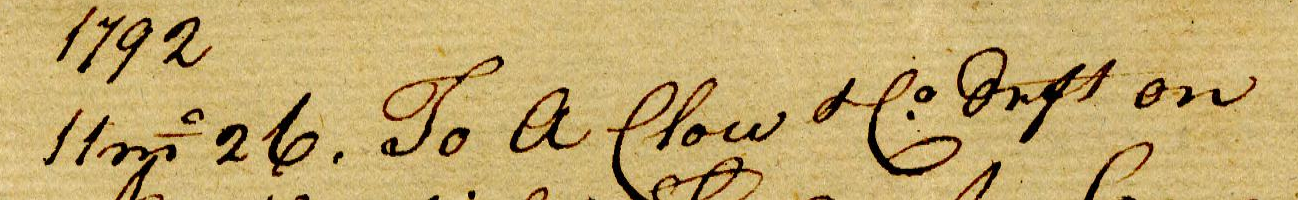11 m^o 26. To A Clow & C^o. drft on
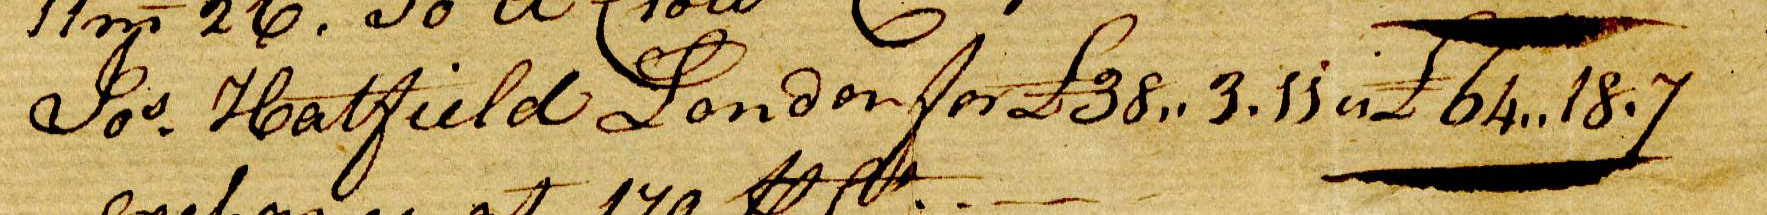Jos. Hatfield London for £38..3.55 is £64..18.7
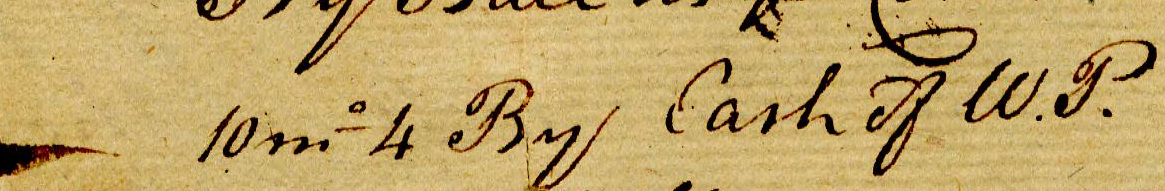10 m^o 4 By Cash of W.P.
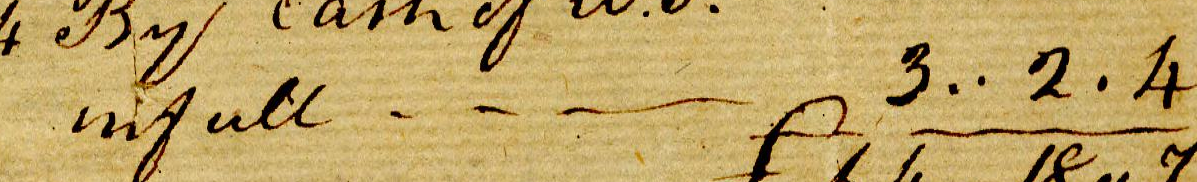in full --- 3..2.4
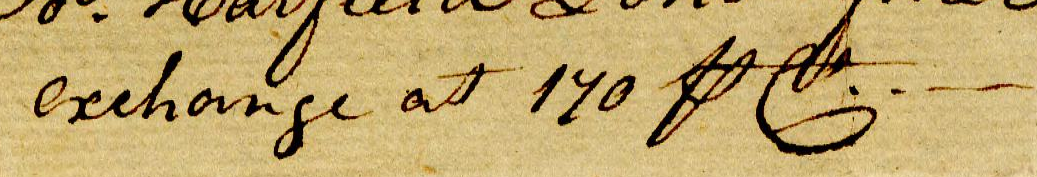exchange at 170 per C^t.-
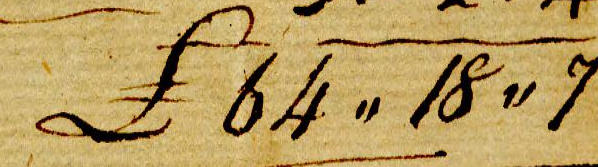£64..18..7
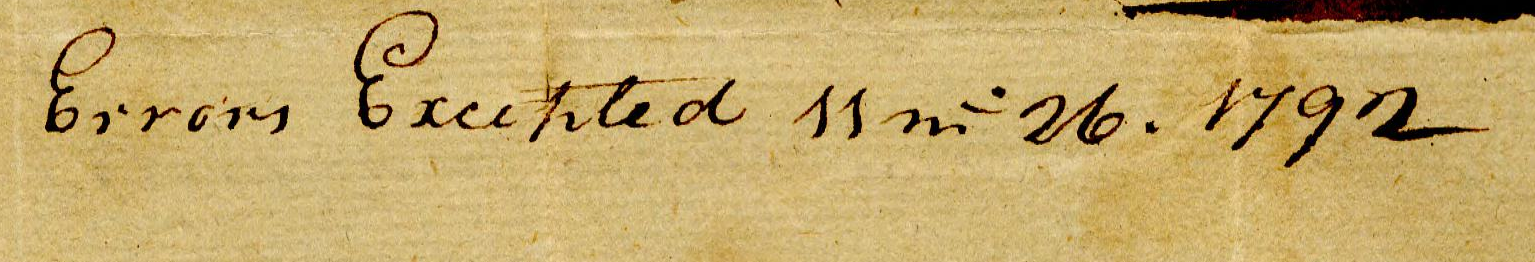Errors Excepted 11 m^o 26 1792
